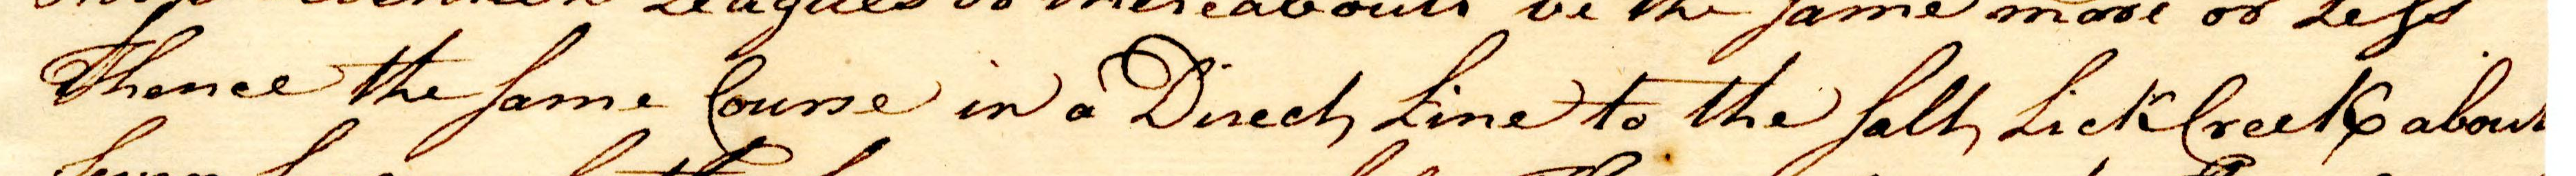Thence the same Course in a Direct Line to the Salt Lick Creek about
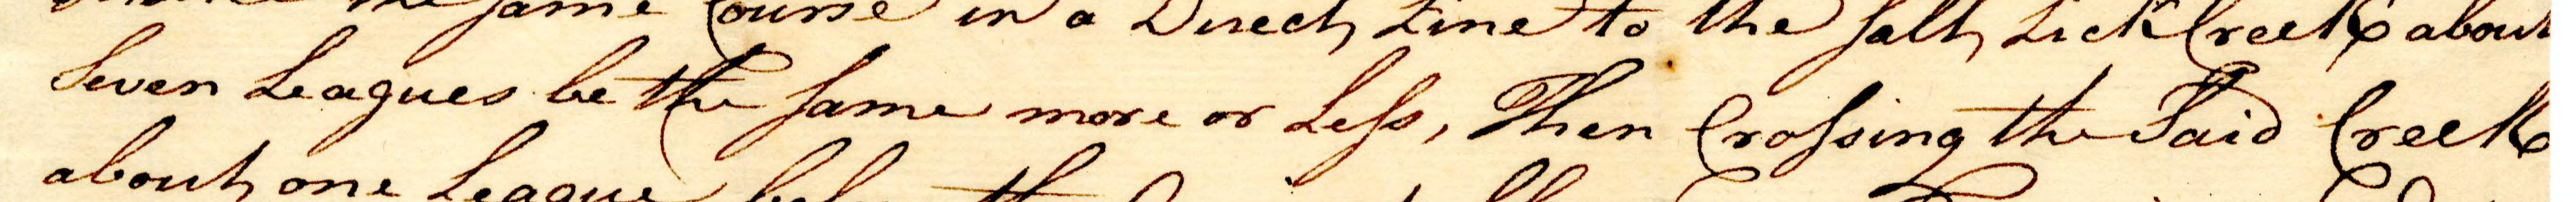Seven Leagues be the same more or Less, Then Crossing the said Creek
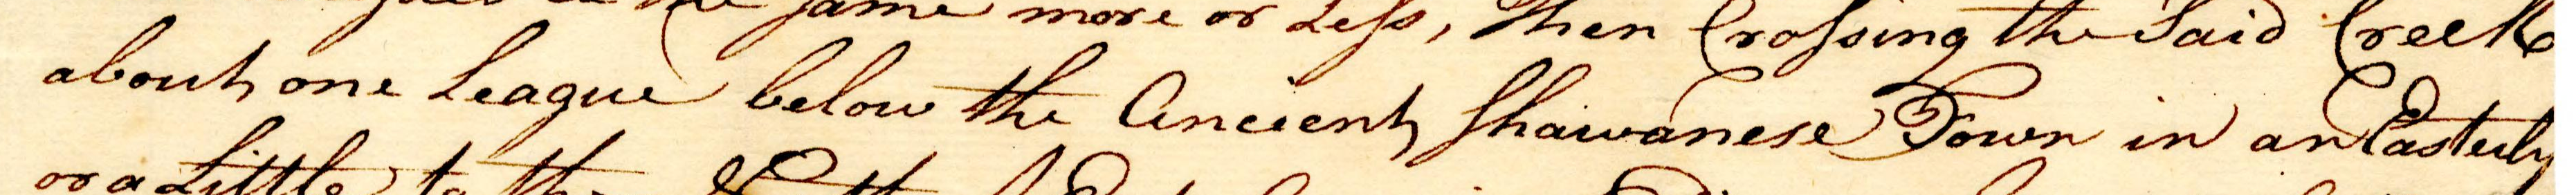about one League below the Ancient Shawanese Town in an Easterly
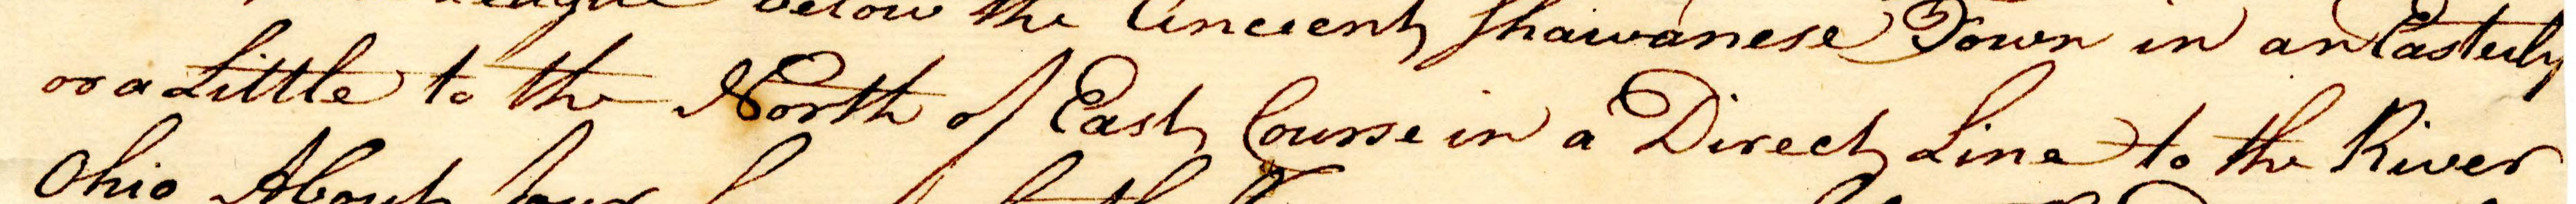or a Little to the North of East Course in a Direct Line to the River
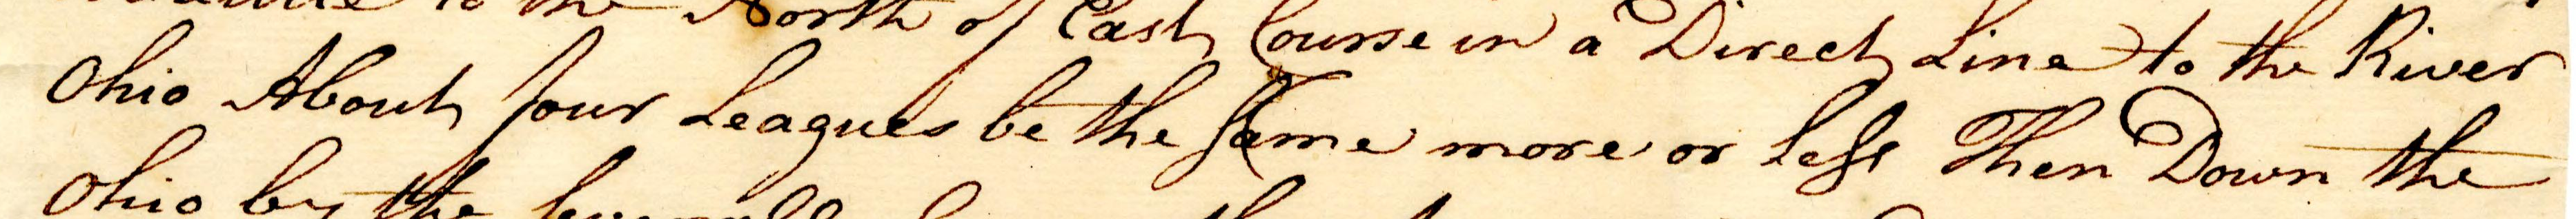Ohio About four Leagues be the same more or less Then Down the
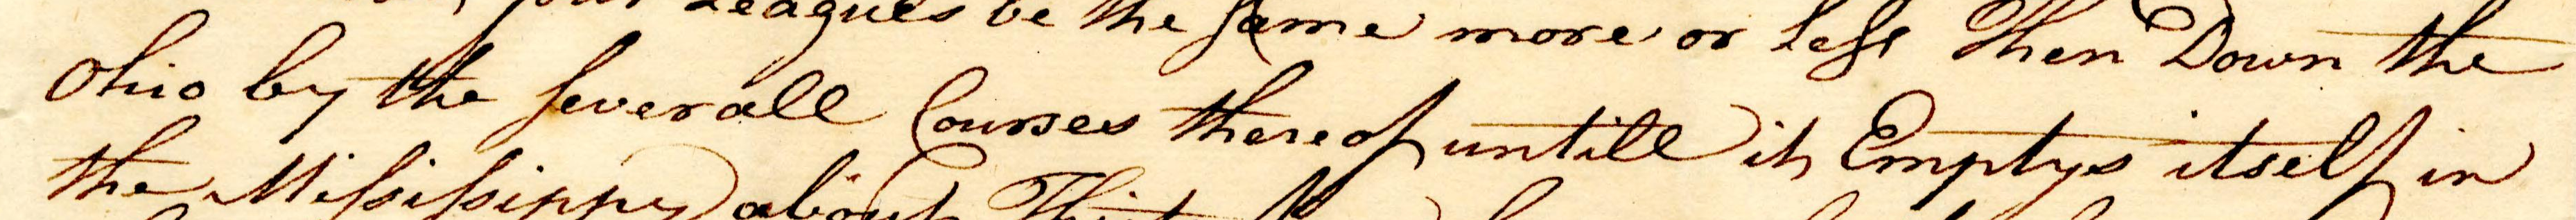Ohio by the severall Courses thereof until it Emptys itself in
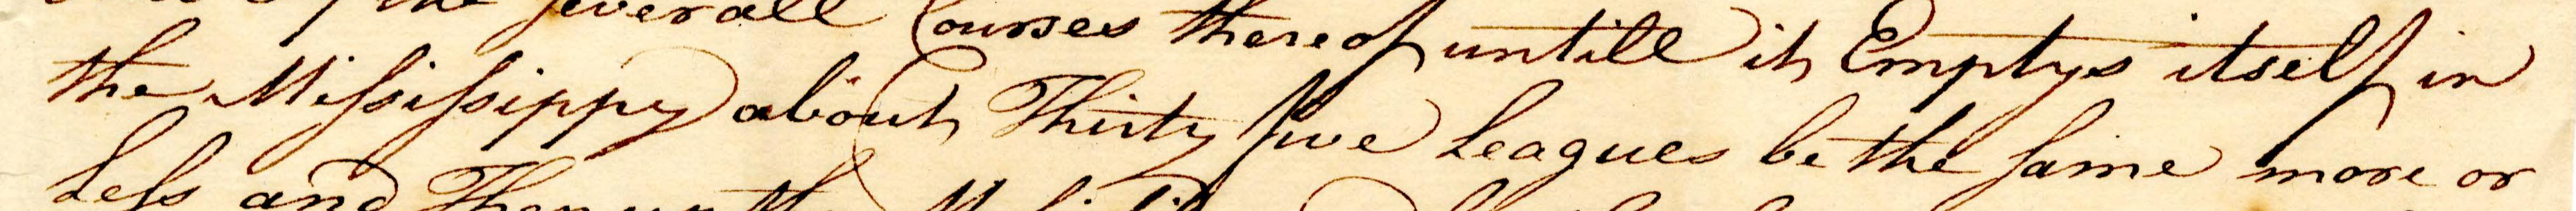the Mississippy about Thirty five Leagues be the same more or
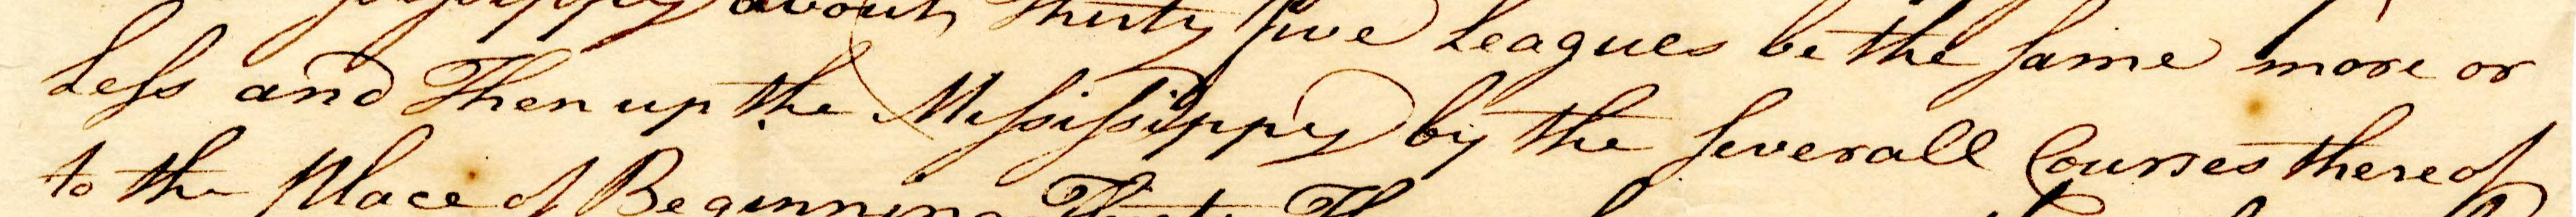Less and Then up the Mississippy by the severall Courses thereof
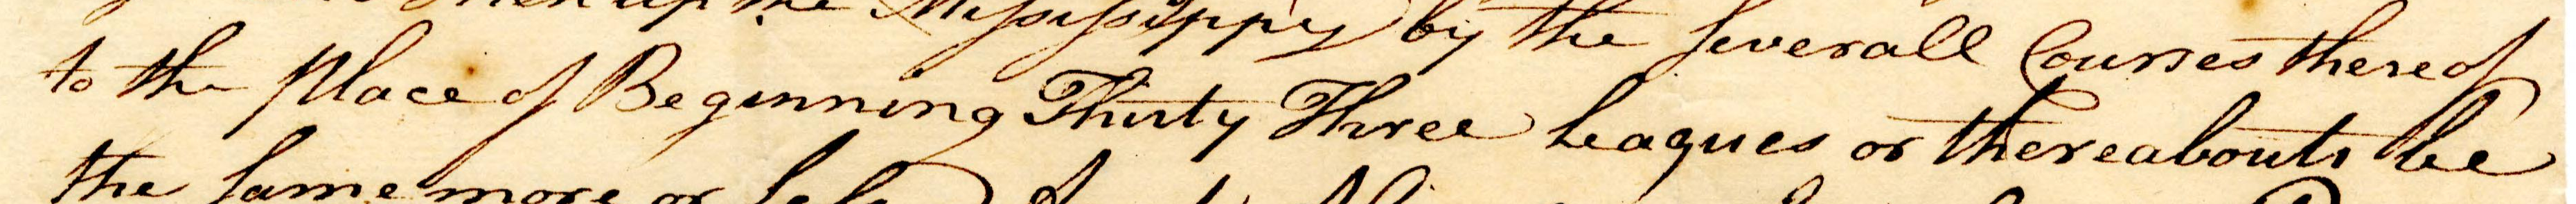to the place of Beginning Thirty Three leagues or thereabouts be
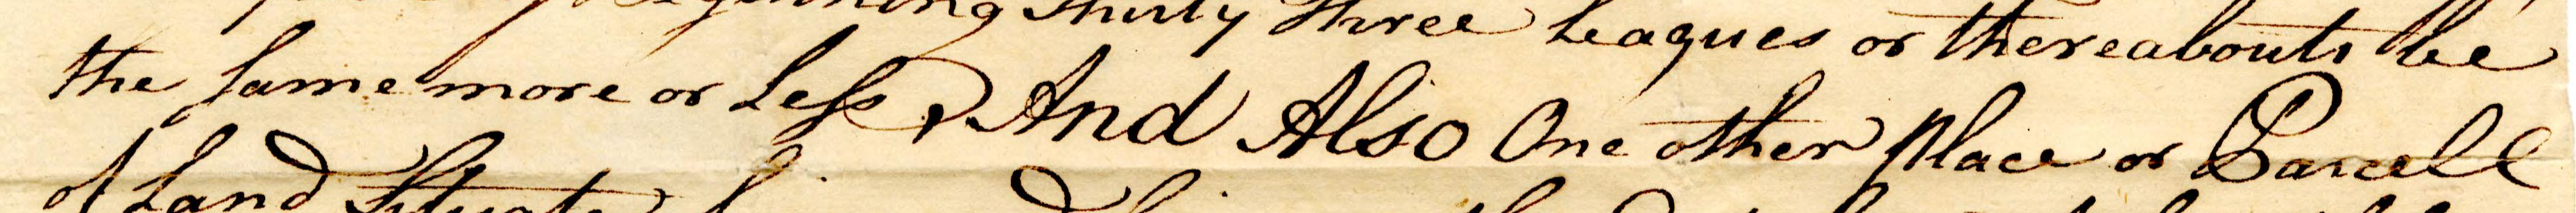the same more or Less And Also One other place or Parcell
